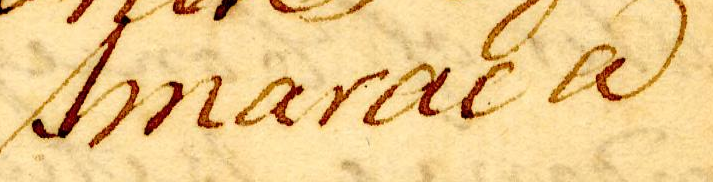Amaraca
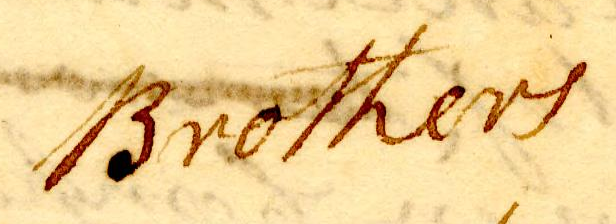Brothers
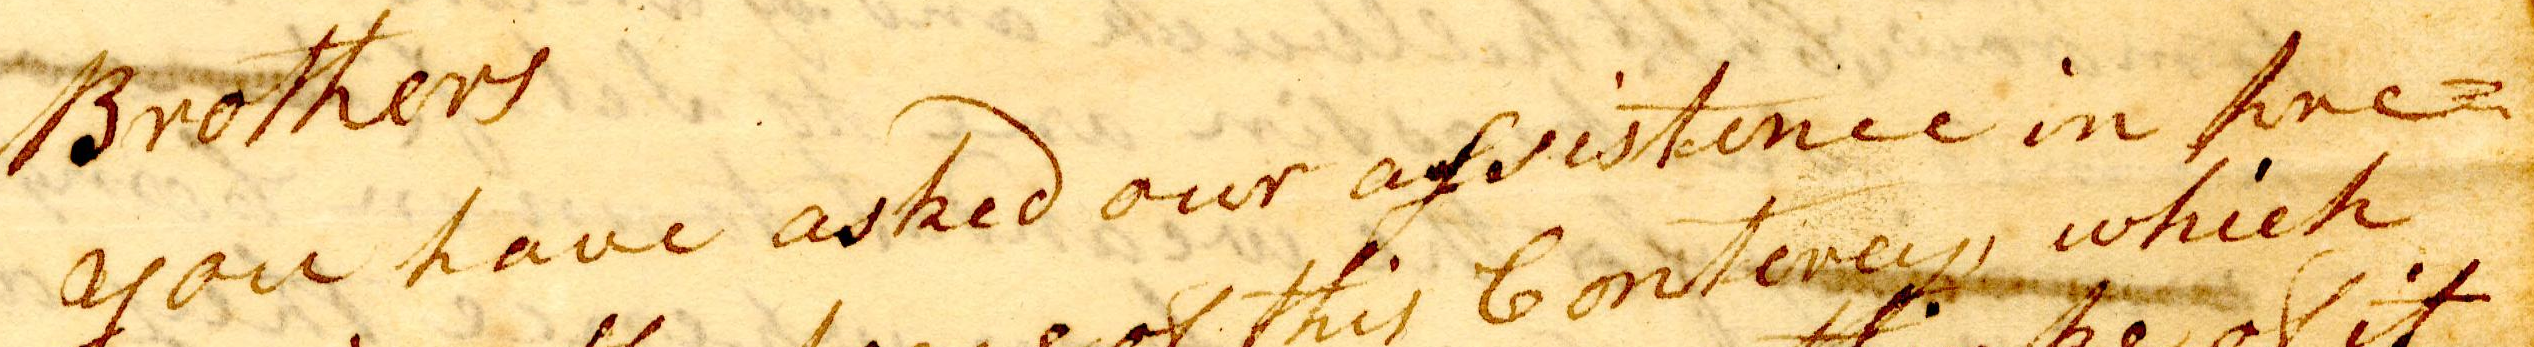you have asked our assistence in pre-
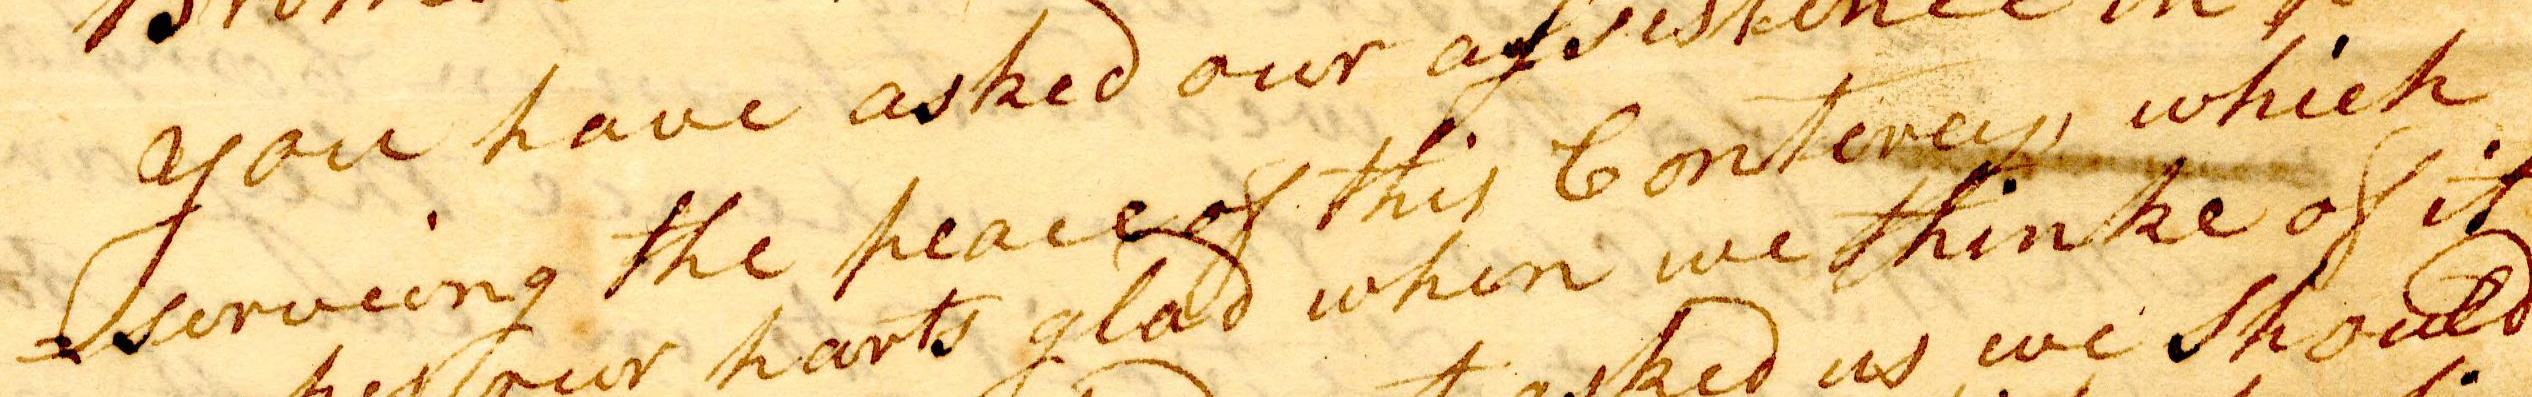-serveing the peace of this Conterey, which
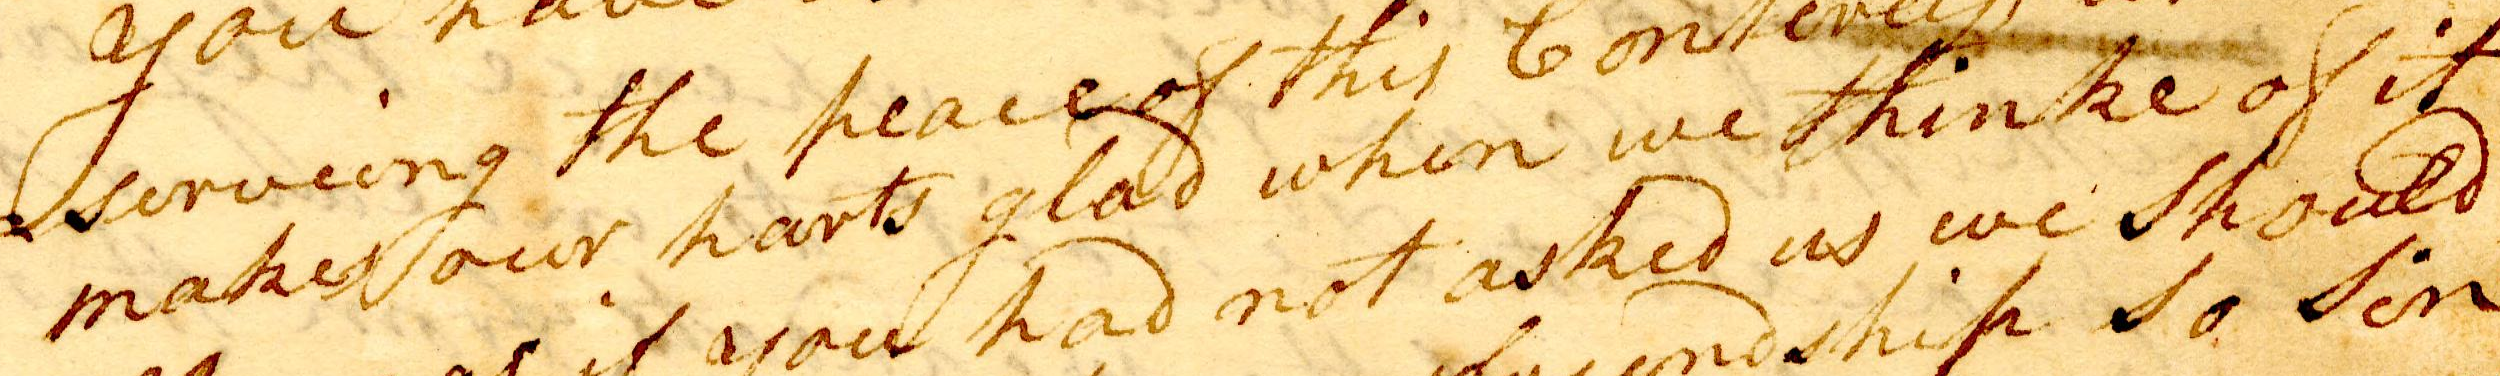makes our harts glad when we thinke of it
